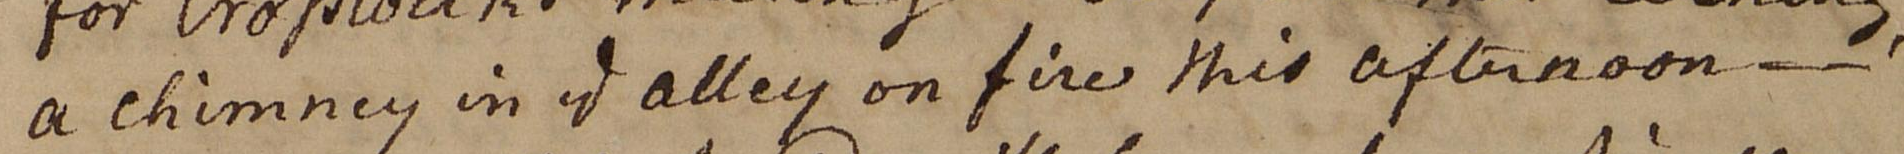a chimney in y^e alley on fire this afternoon-
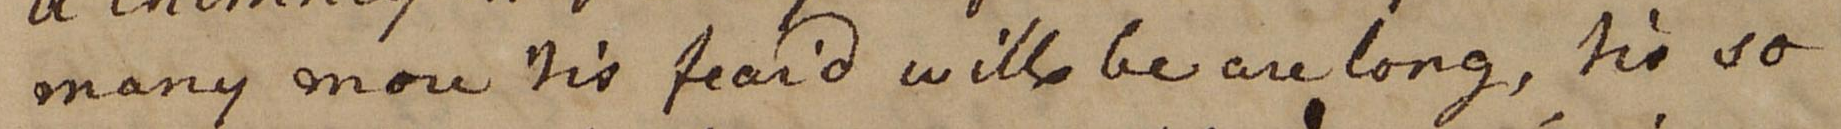many more 'tis fear'd will be are long, tis so
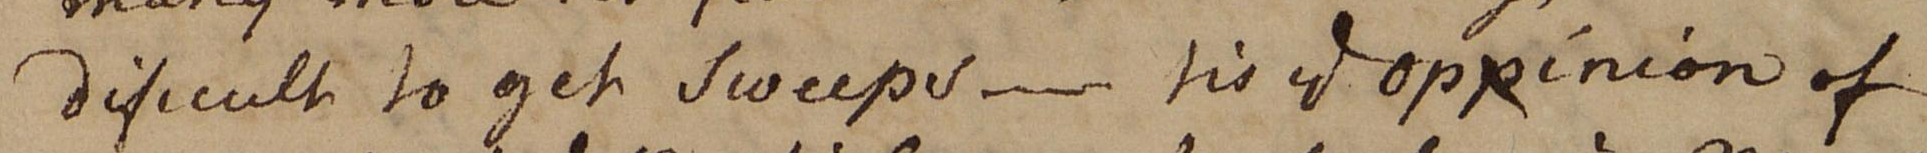dificult to get Sweeps- tis y^e oppinion of
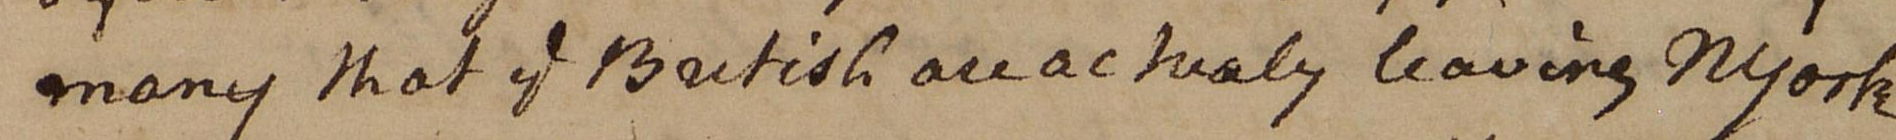many that y^e British are actualy leaving NYork
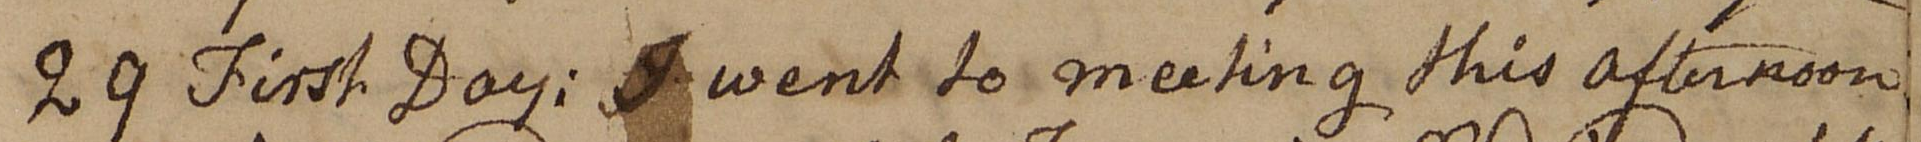2 9 First Day: I went to meeting this afternoon
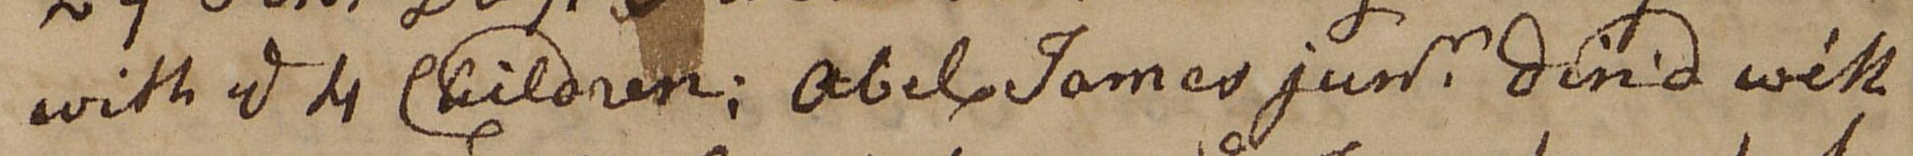with y^e 4 Children; Abel James jun^r. din'd with
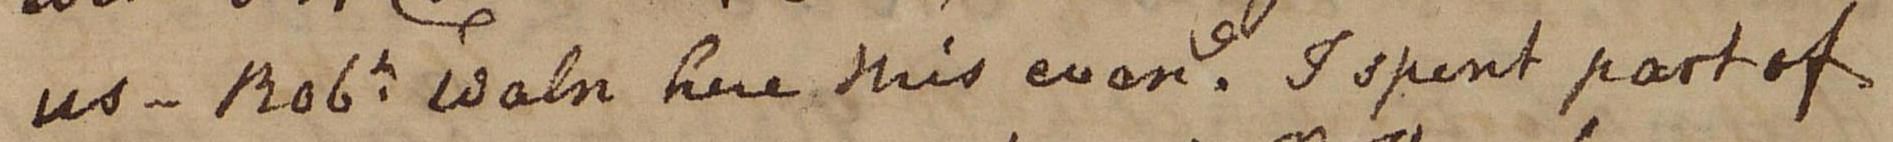us- Rob^t. Waln here this even^g. I spent part of
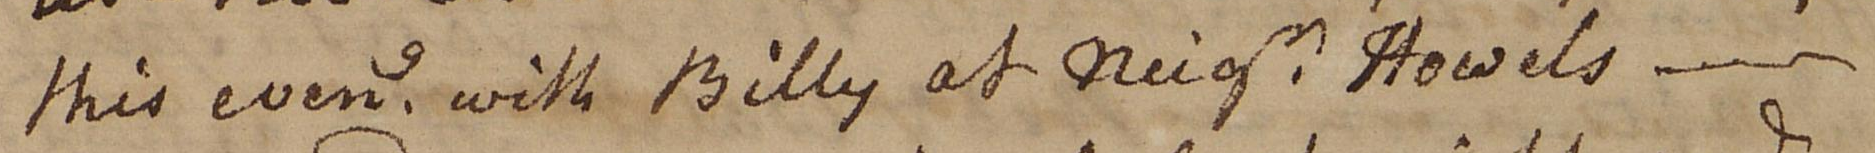this even^g. with Billy at Neig^r. Howels-
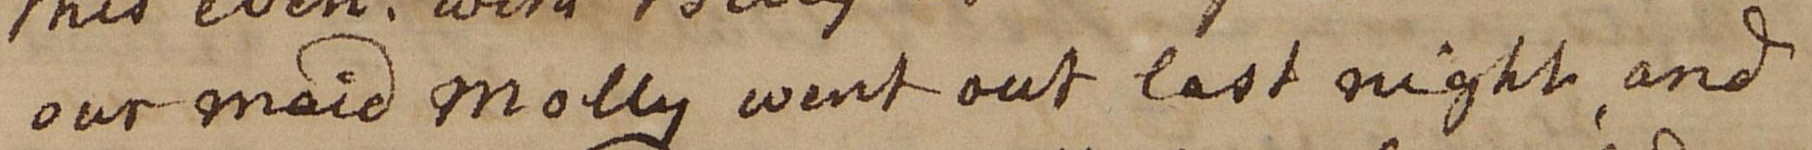our maid Molly went out last night, and
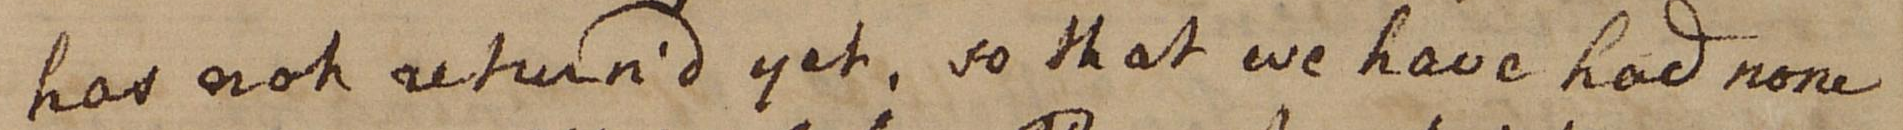has not return'd yet, so that we have had none
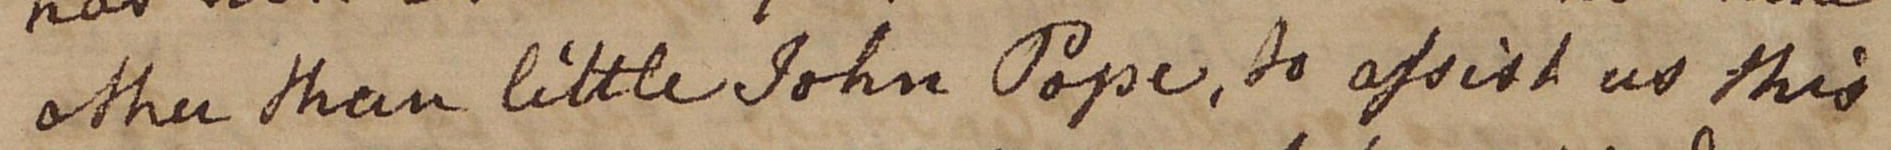other than little John Pope, to assist us this
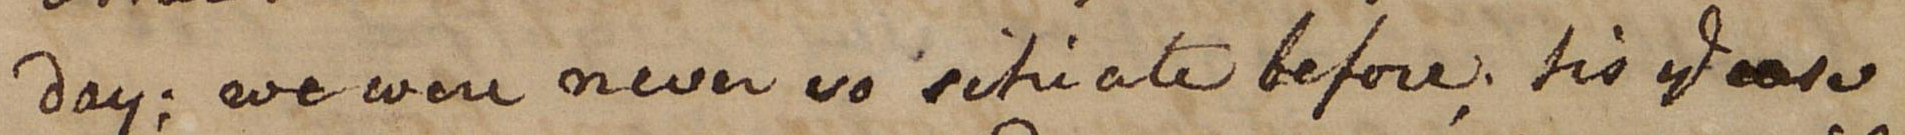day; we were never so sitiate before; tis y^e ears
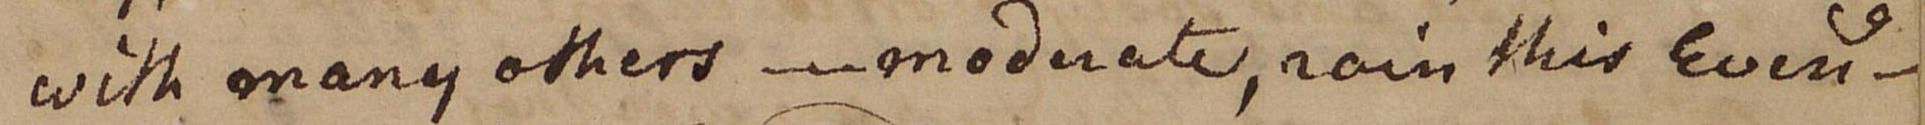with many others- moderate, rain this Even^g-
